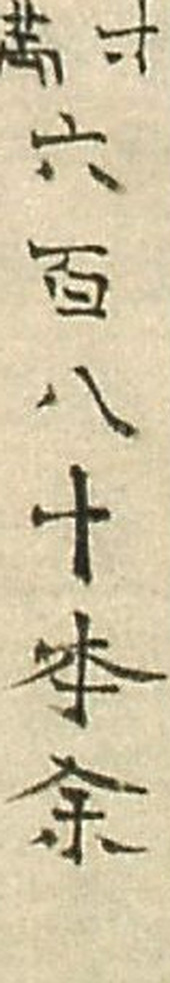苗百八十本余
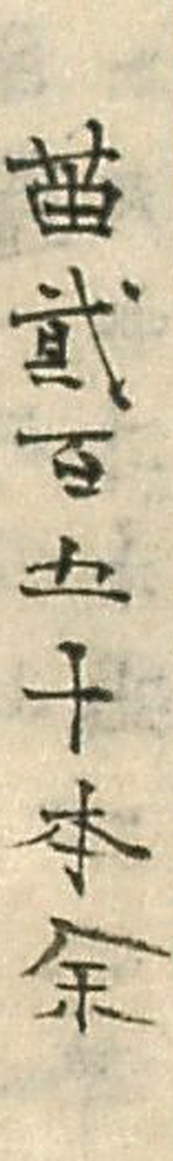苗弐百五十本余
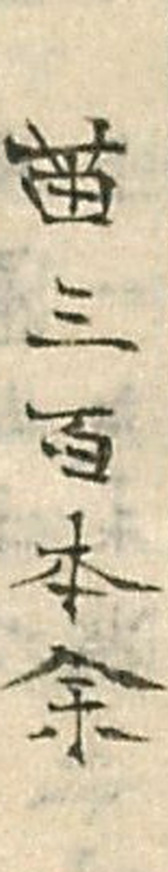苗三百本余
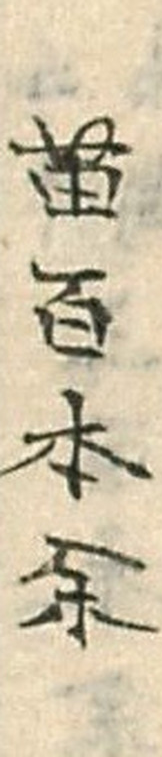苗百本余
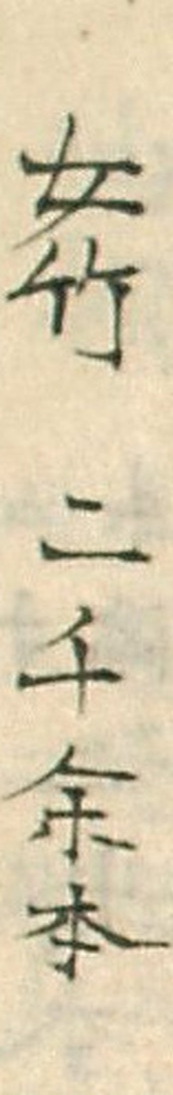女竹二千余本
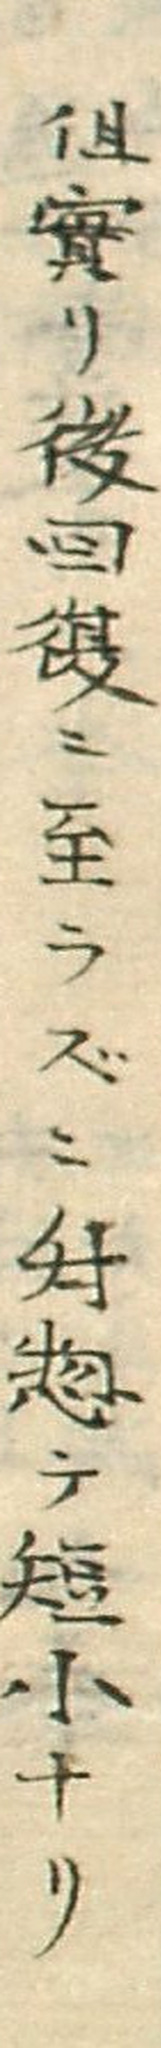但実リ後回復二至ラズニ付惣テ短小ナリ
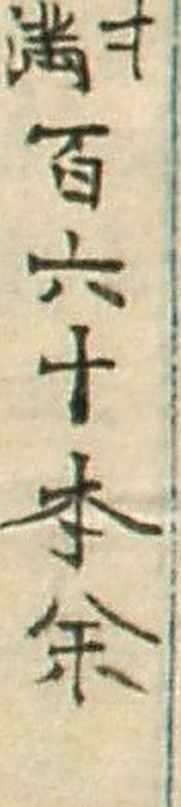苗百八十本余

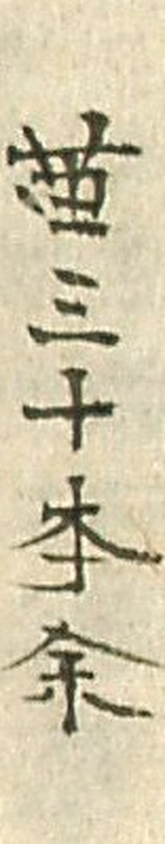苗三十本余
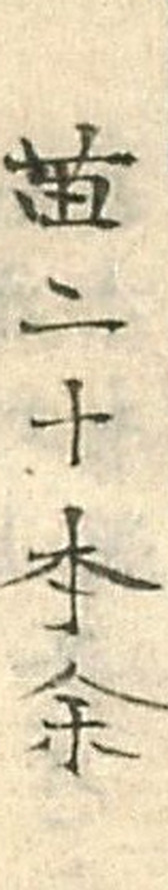苗二十本余
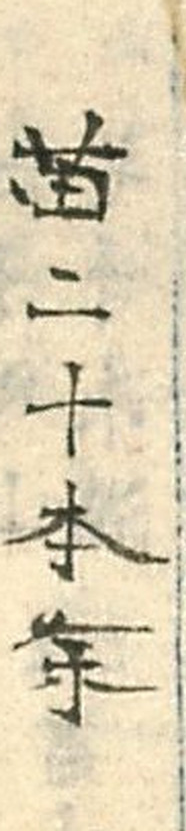苗二十本余

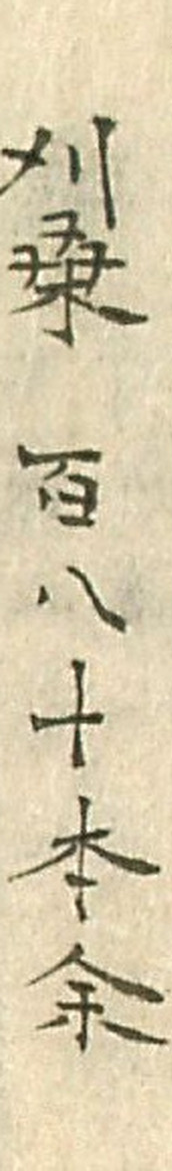刈桑百八十本余
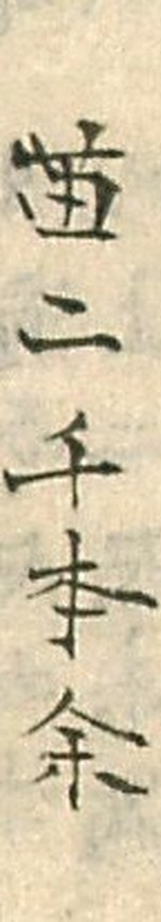苗二千本余
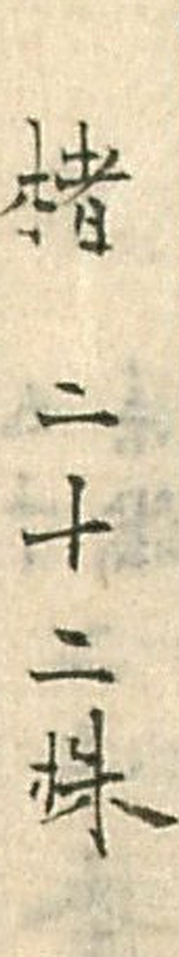楮二十二株
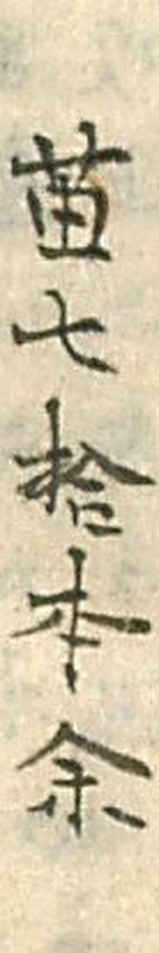苗七拾本余
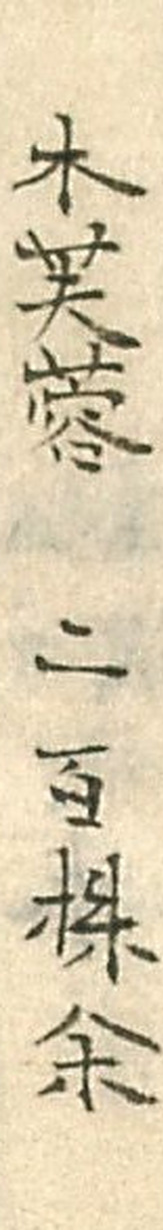木芙蓉二百株余
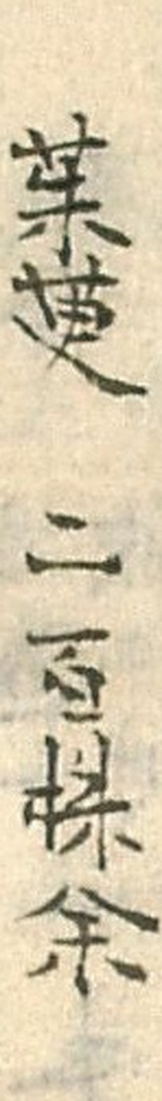茱萸二百株余
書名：山林共進会取調書
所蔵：鳴門教育大学 Naruto University of Education
